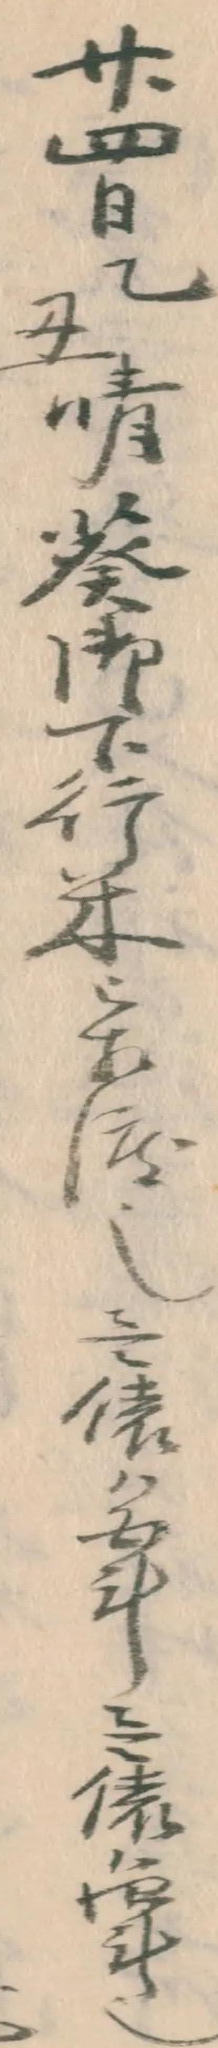廿四日乙丑晴葵御下行米被相渡也壱俵ハ五斗壱俵ハ四斗也
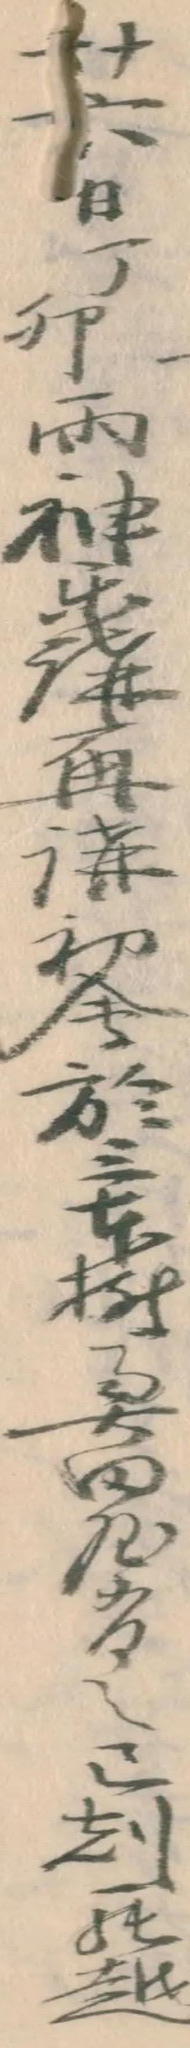廿六日丁卯雨神楽講再講初會於三本樹奥田屋有之巳刻罷越
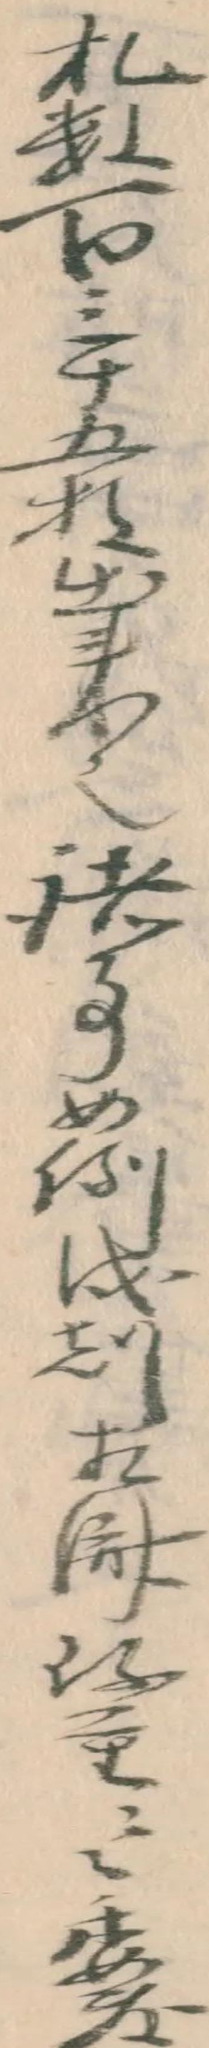札数百三十五枚出来也諸事如例戌刻相済珍重云々委敷
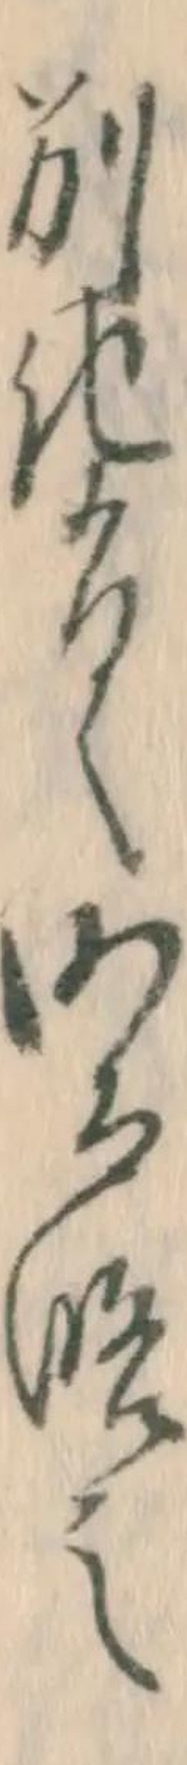別記有之仍而略之
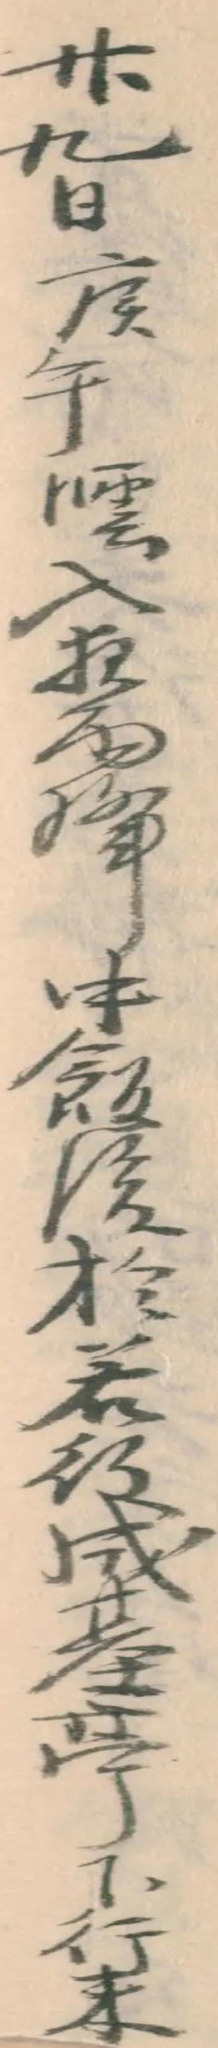廿九日庚午曇入相雨降中飯後於若役成基亭下行米
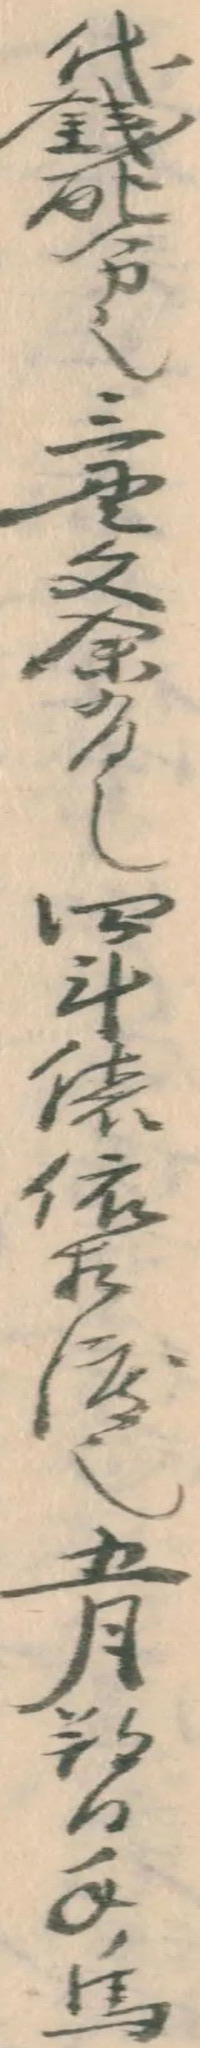代銭配分也三貫文余有之四斗俵依相渡也五月朔日手ノ馬
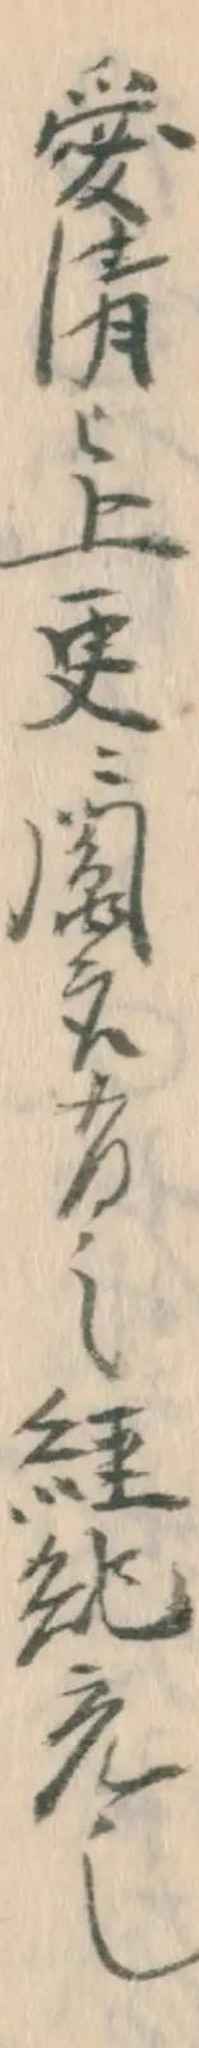愛清被上更ニ鬮取有之経紀充也
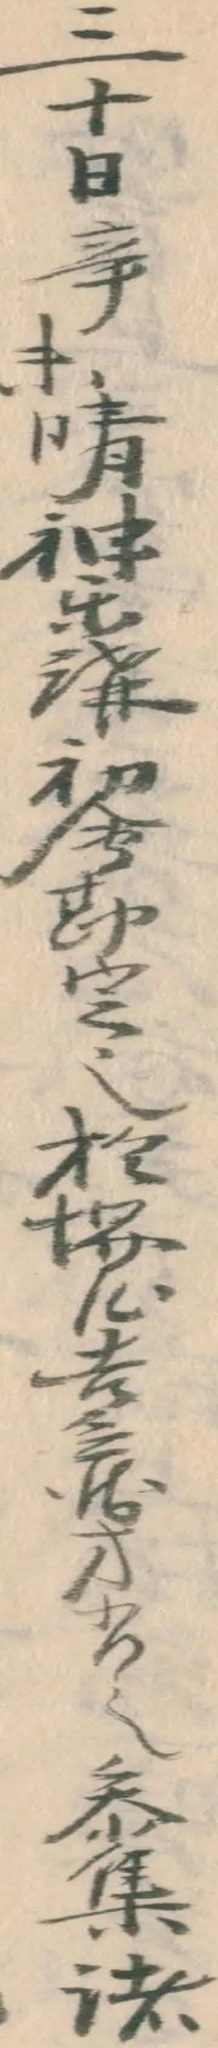三十日辛未晴神楽講初會勘定也於堺屋吉兵衛方有之参集諸
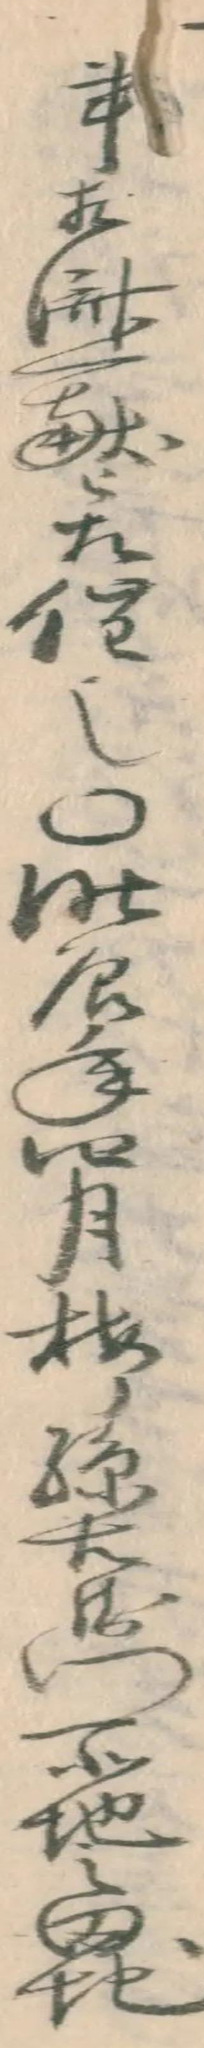事相済一献被相催也○昨辰年四月梅ノ孫左衛門所地之田地
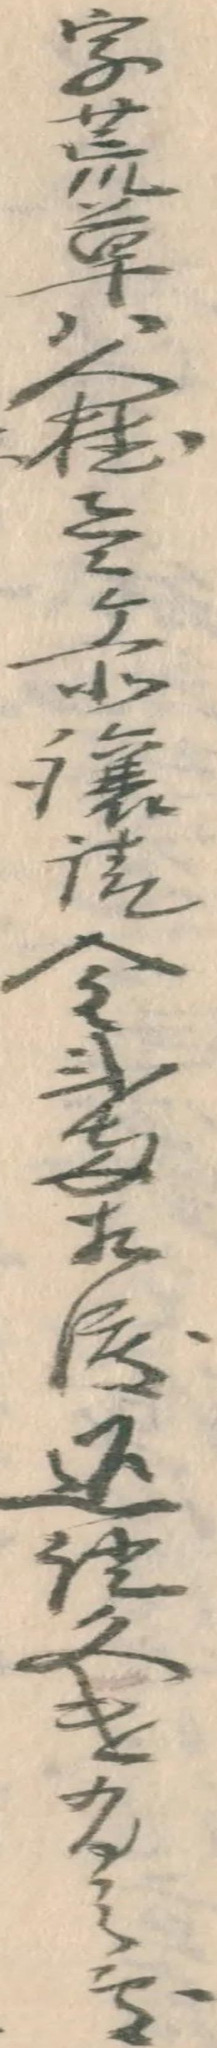字荒草八人植壱ヶ所譲請金弐両相渡返證文遣有之處
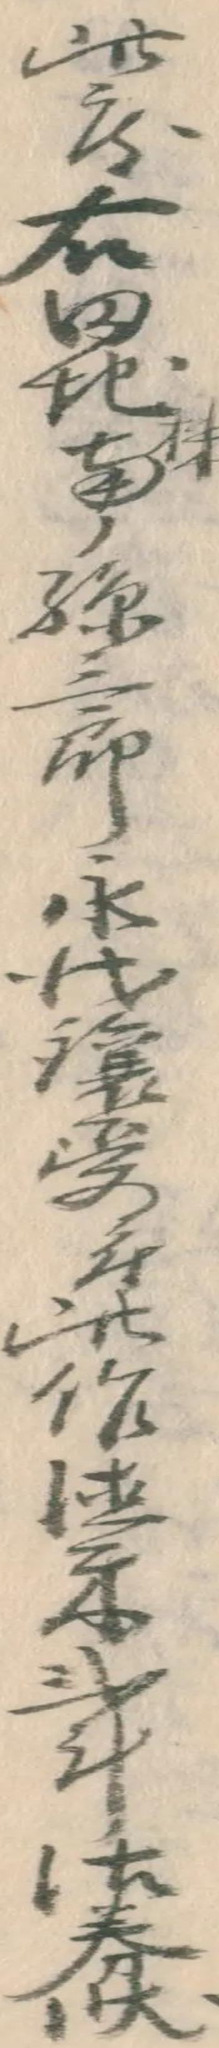此度右田地前株南ノ孫三郎永代譲受ニ付此作徳米弐斗沽券状
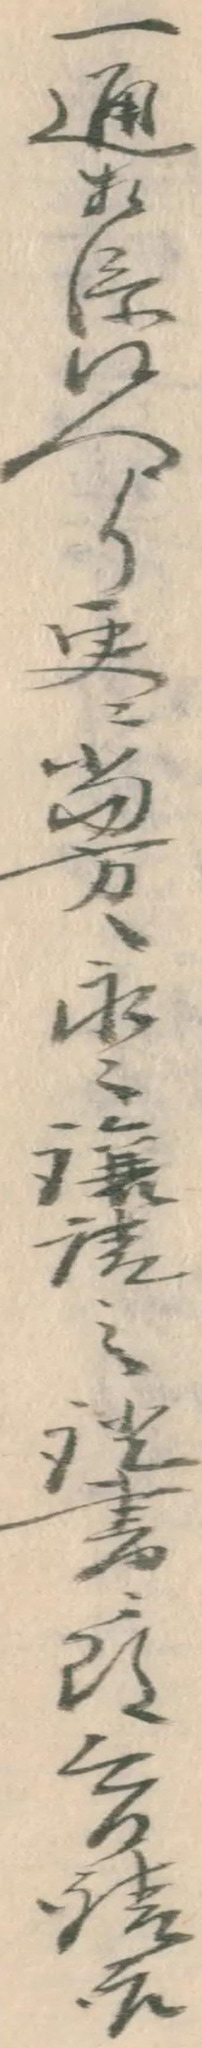一通相添郷人より更に當方へ永々譲請之證書に改今日請取
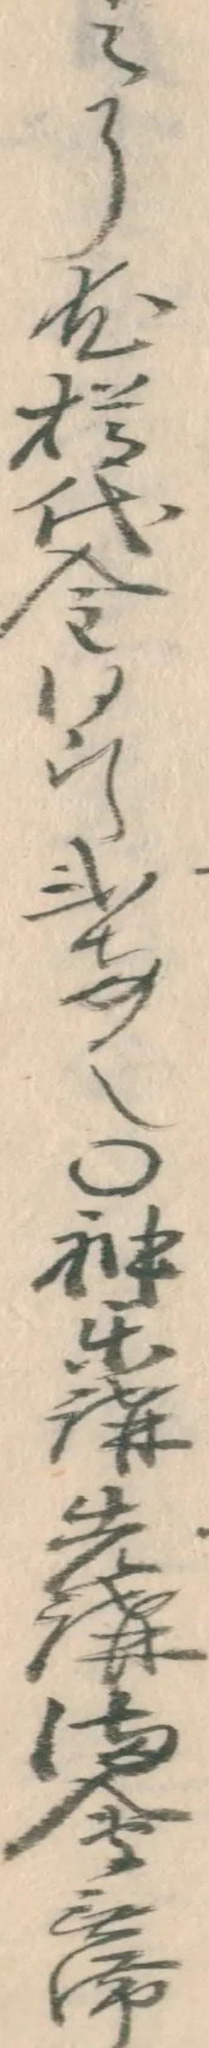之了尤樽代金同断弐両也〇神楽講先講満會無滞
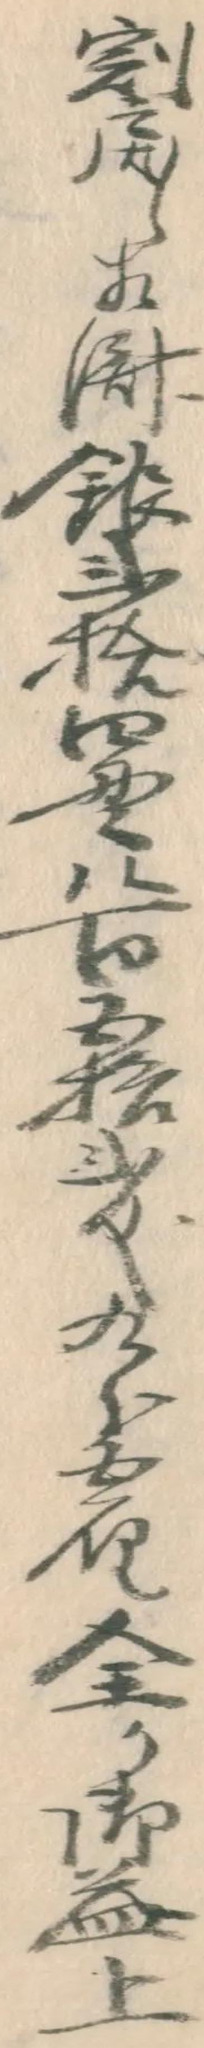割戻し相済銀弐拾四貫八百五拾弐匁九分五厘全ク御益上
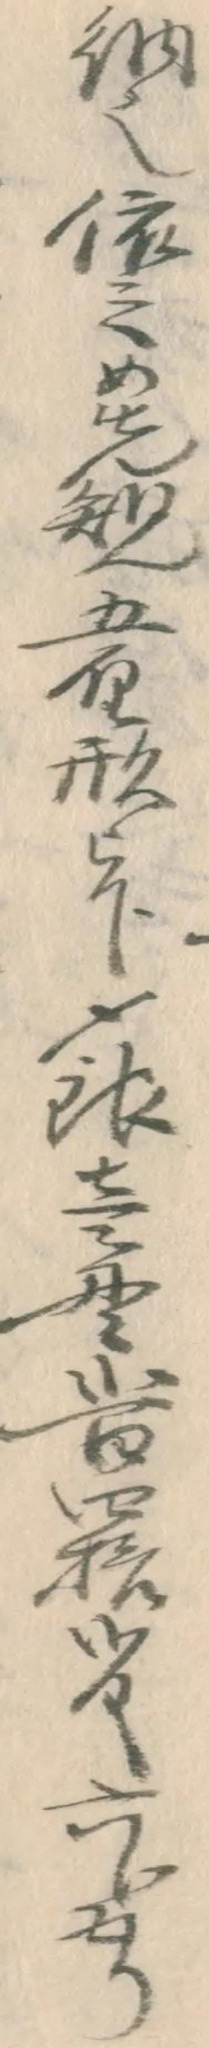納也依之如先規五厘形被下〆銀壱貫弐百四拾弐匁六分五り
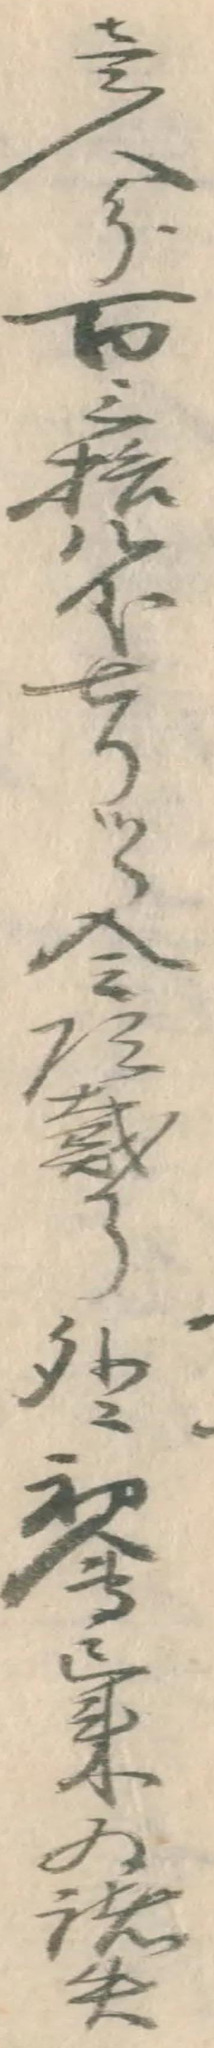壱人分百三拾八匁七りツヽ金頂戴了外ニ初會已来為諸失
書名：賀茂社記録. 第66冊
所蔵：国立国会図書館 National Diet Library, JAPAN
